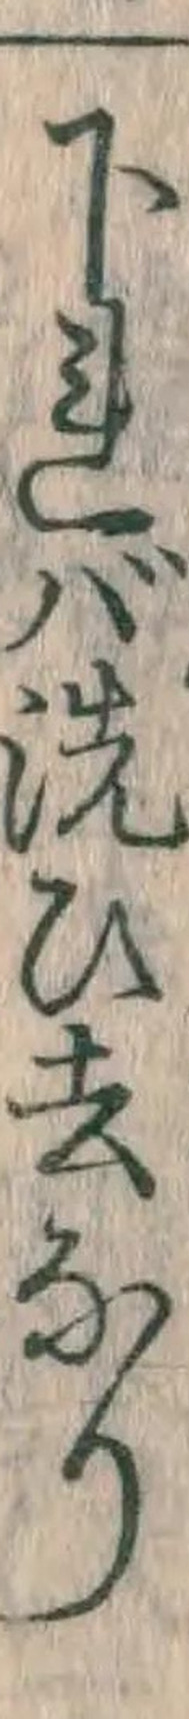下れば洗ひ去なり
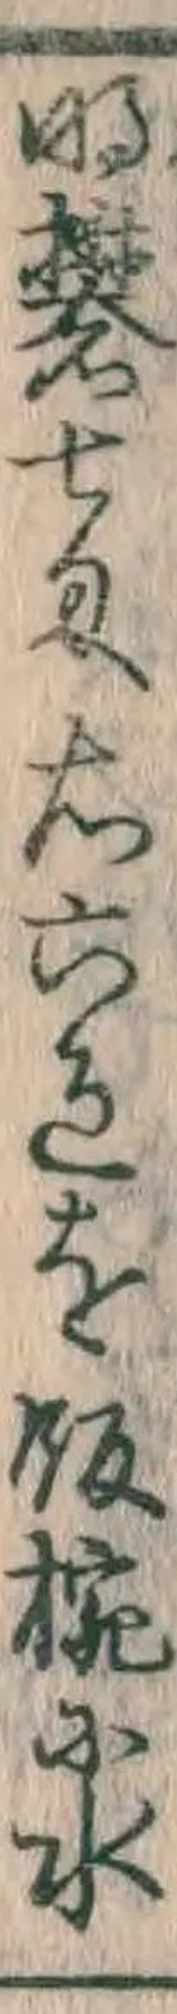明礬七匁右六色を飯椀に水
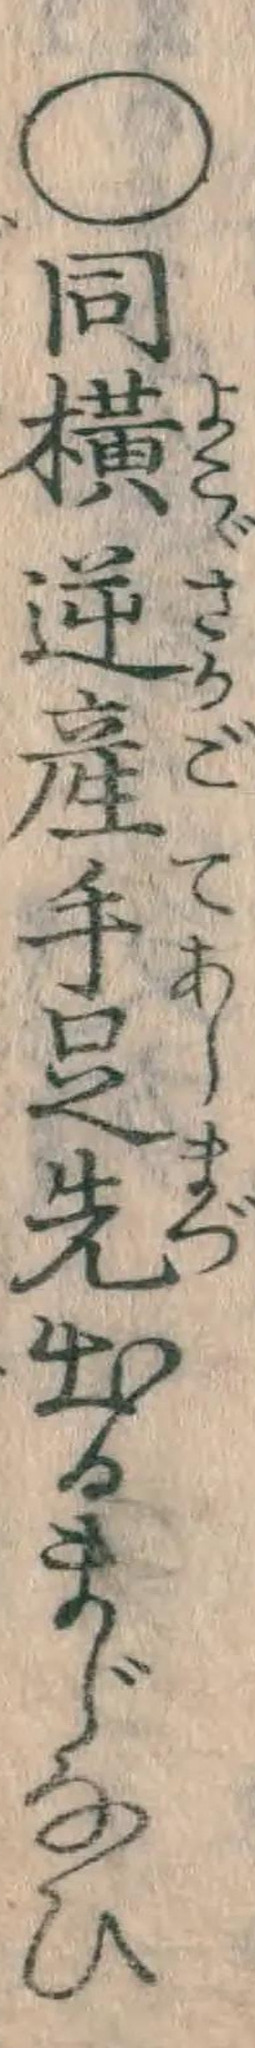○同横逆産手足先出るまじなひ
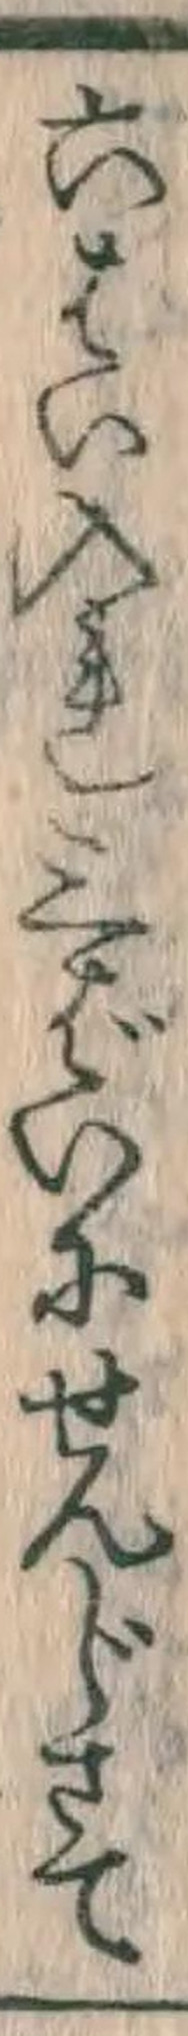六はい入れ三ばいにせんじさて
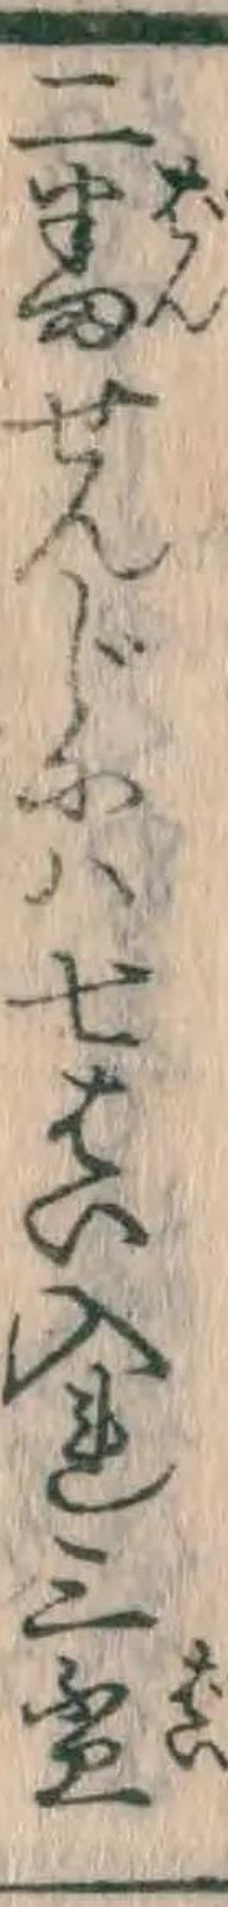二番せんじには七はい入れ三盃
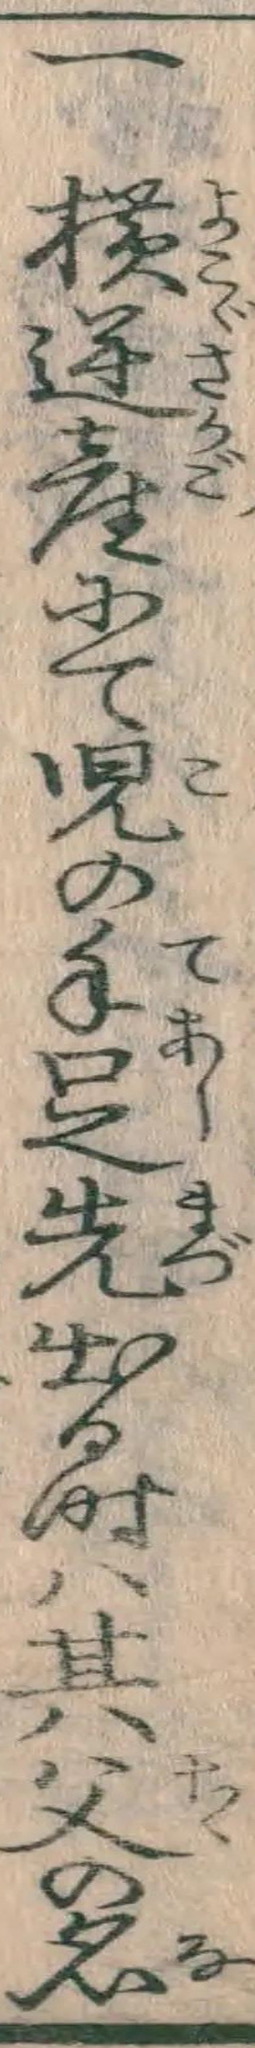一横逆産にて児の手足先出る時は其父の名
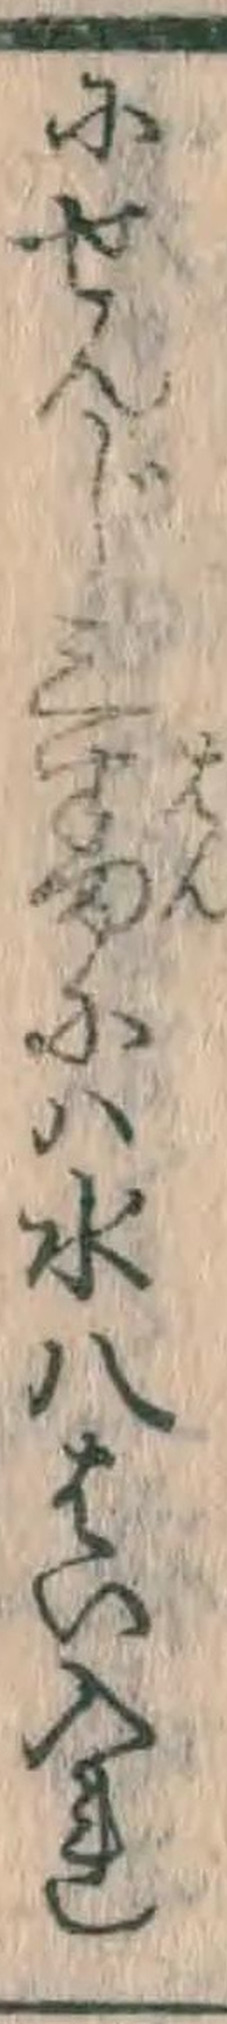にせんじ三番には水八はい入れ
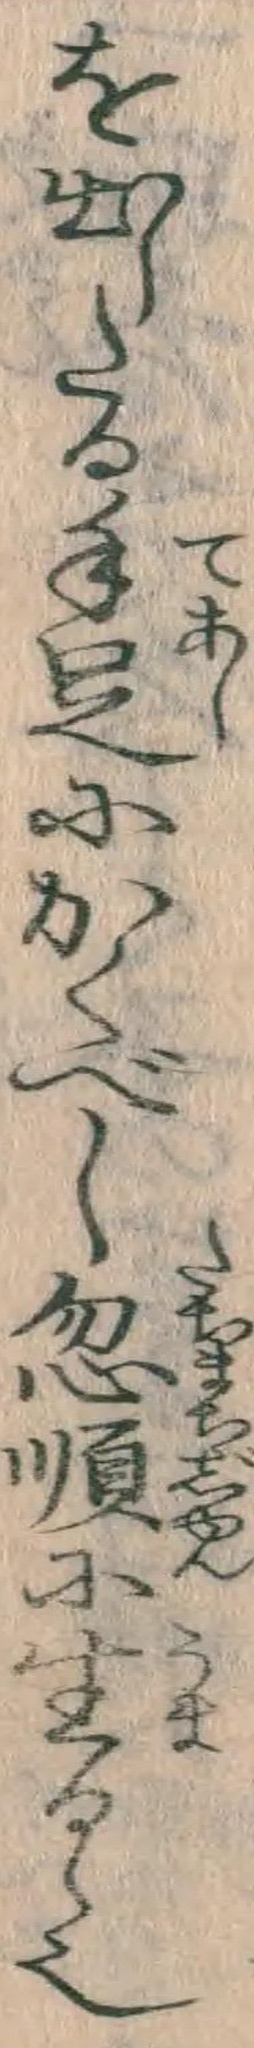を出したる手足にかくべし忽順に生るゝ也
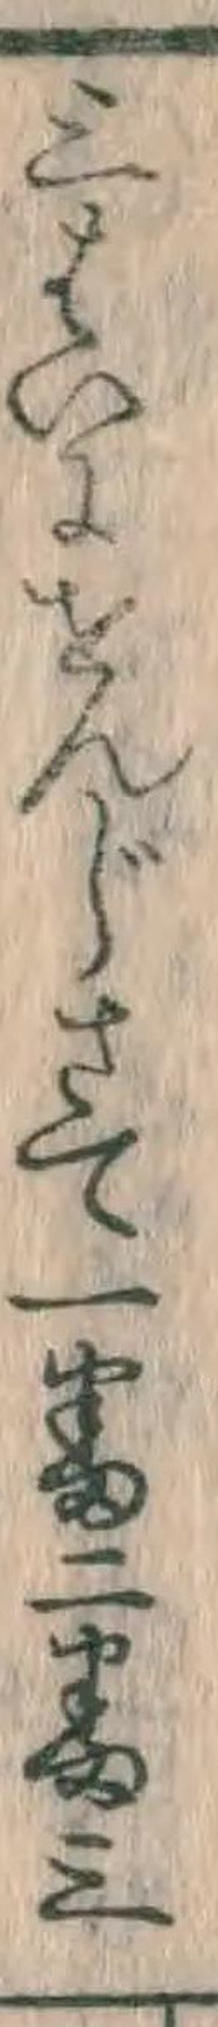三はいにせんじさて一番二番三
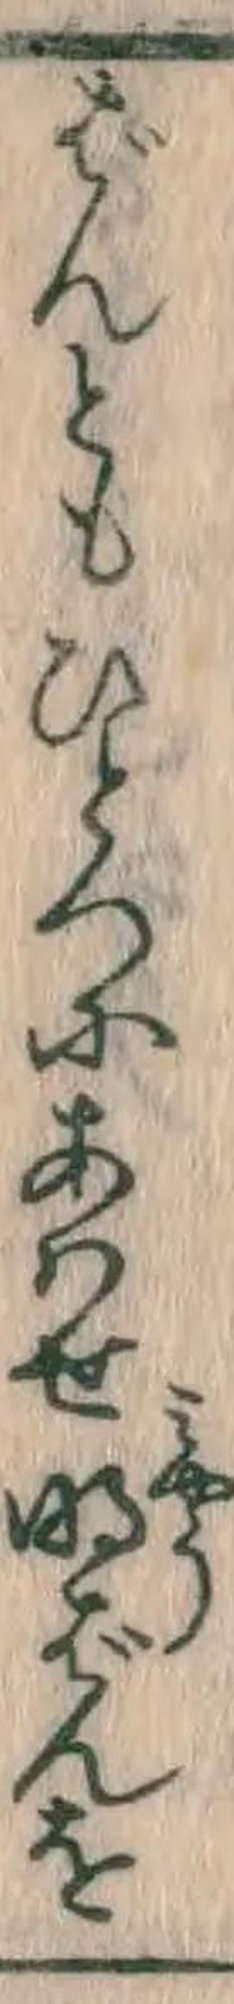ばんともひとつにあはせ明ばんを
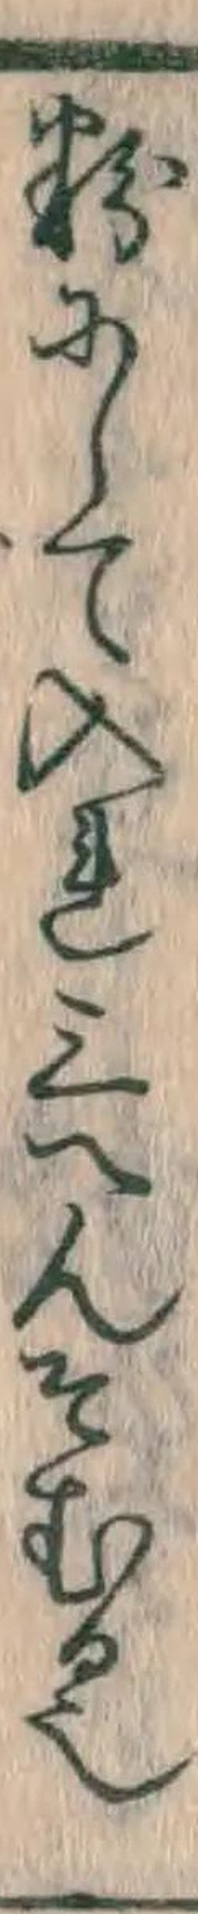粉にして入れ三へんそむる也
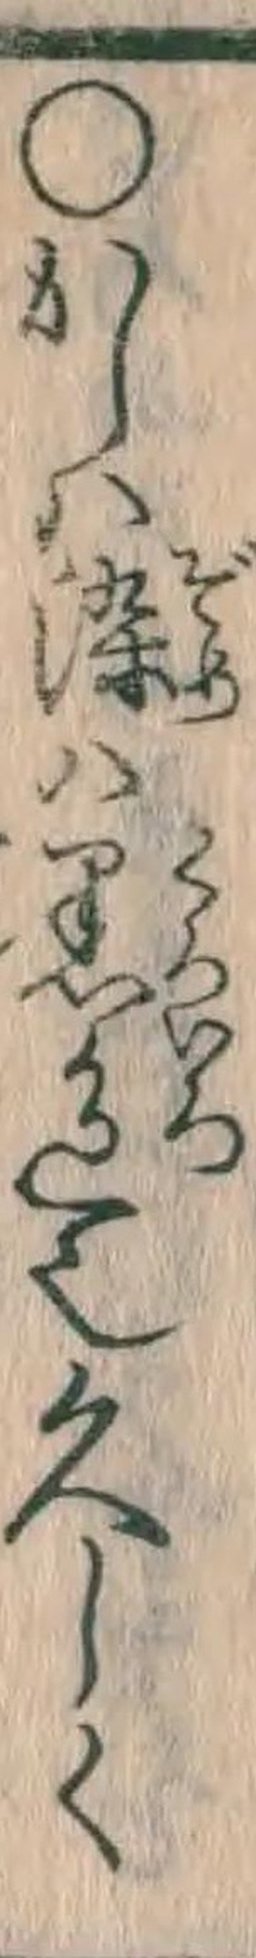○かしは染は黒色也久しく
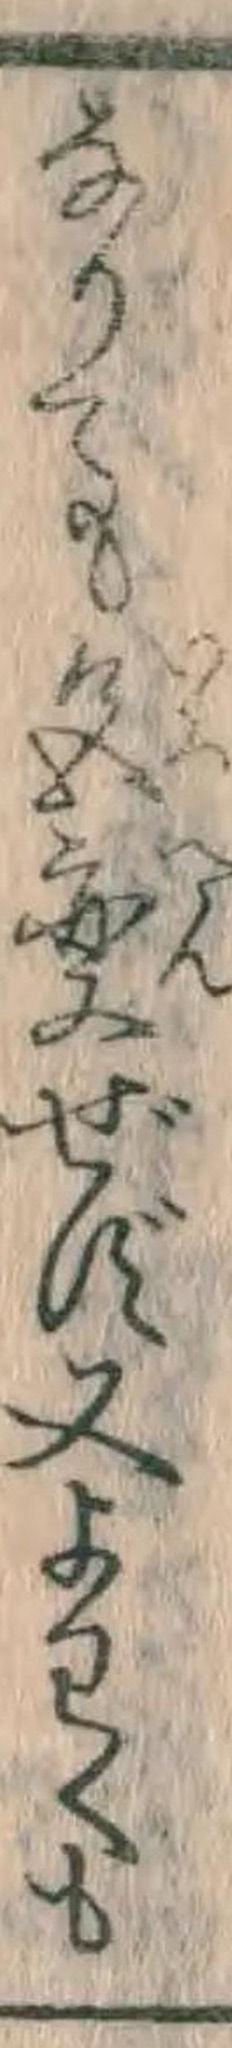なりても色変ぜず又よわくも
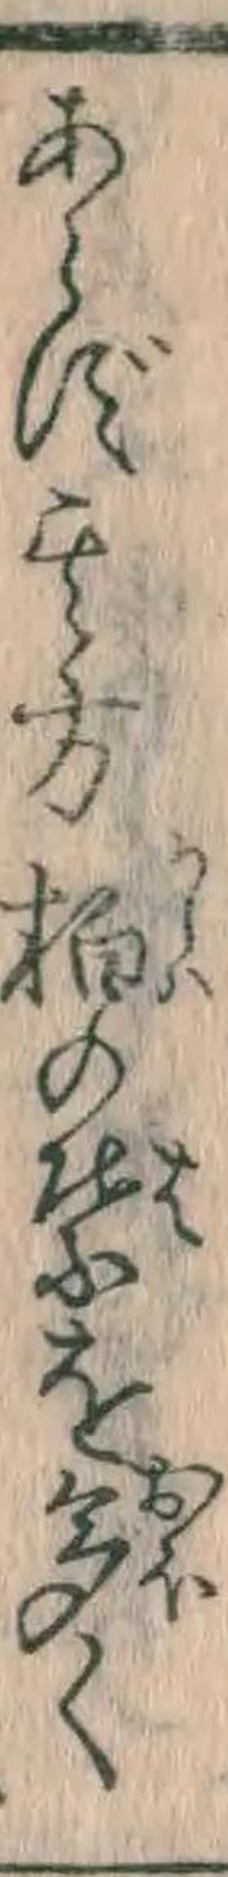あらず其方柏の葉を多く
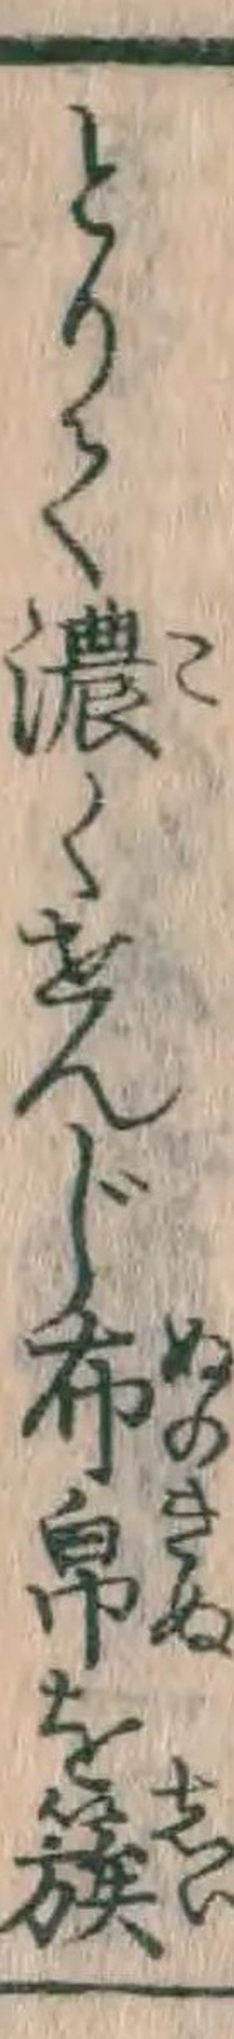とりて濃くせんじ布帛を簇
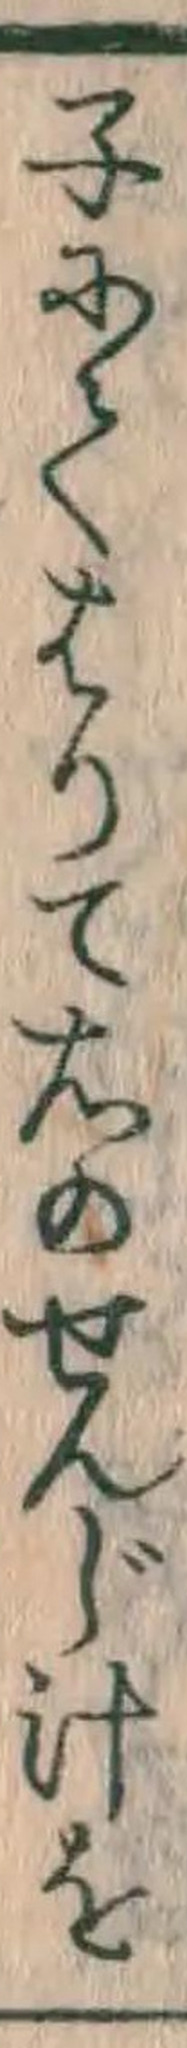子にてはりて右のせんじ汁を
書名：広益秘事大全 3巻. [3]
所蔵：国立国会図書館 National Diet Library, JAPAN
